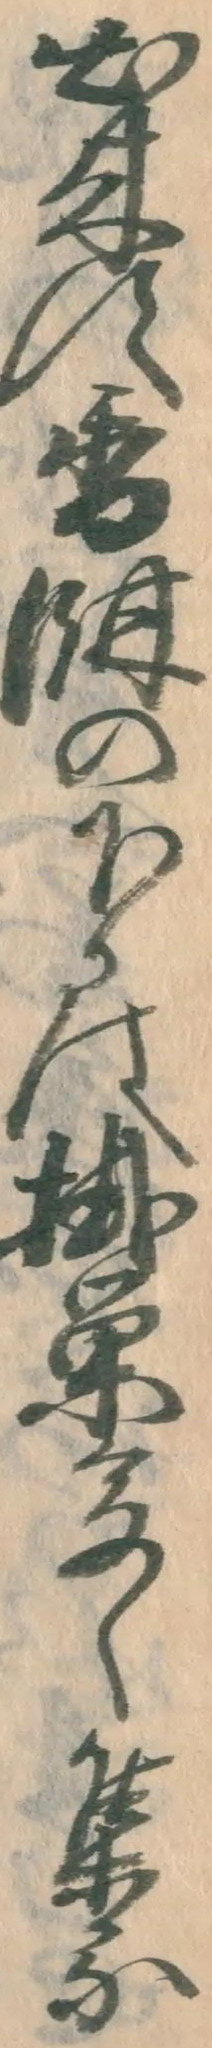出来す香餌の下には掛巣多く集る
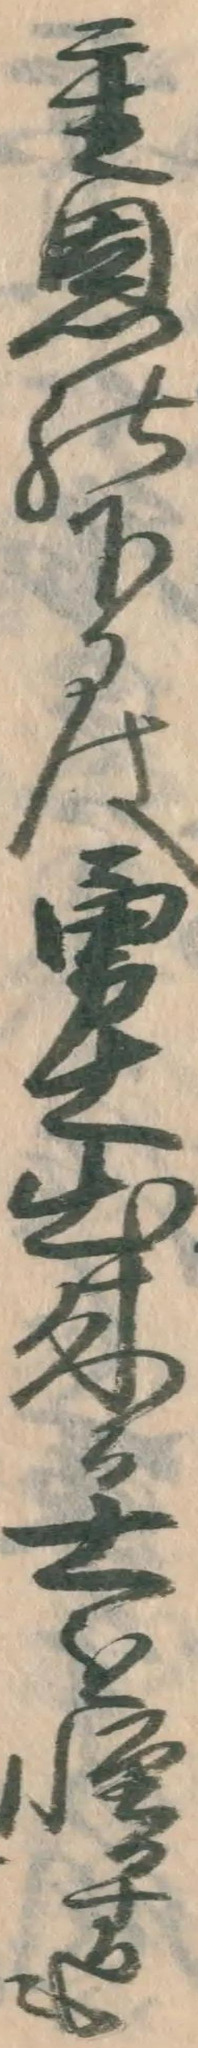重恩の下には勇士出来る士を軽くするも
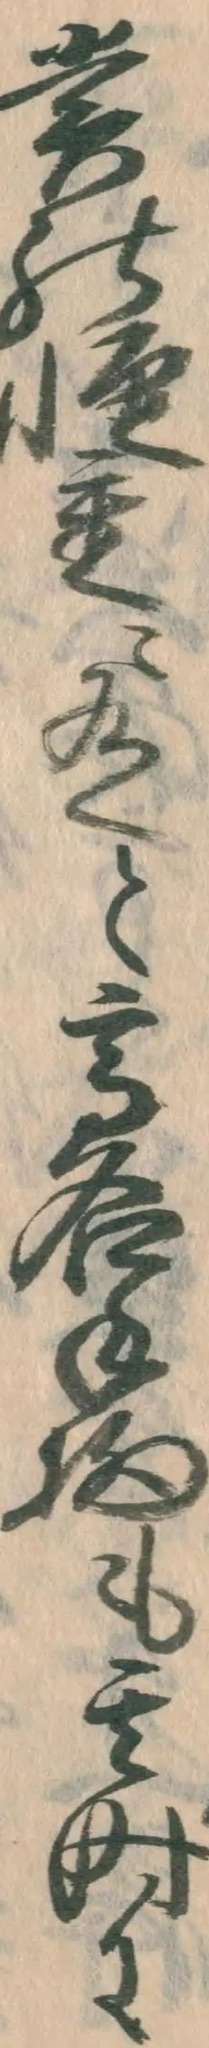賞の軽重ニ有と高名手柄も其時に
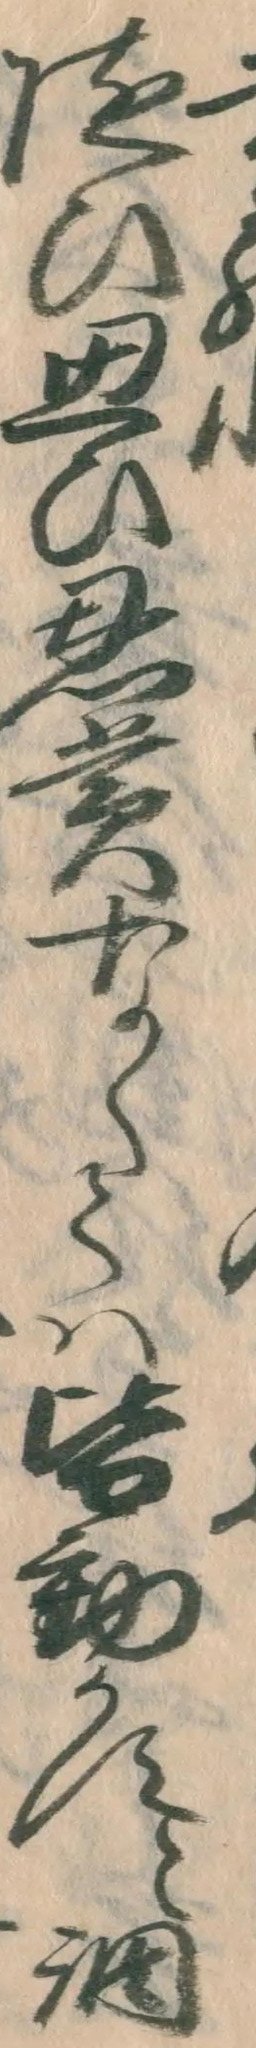随ひ思ひ恩賞なくてハ皆動かすと調
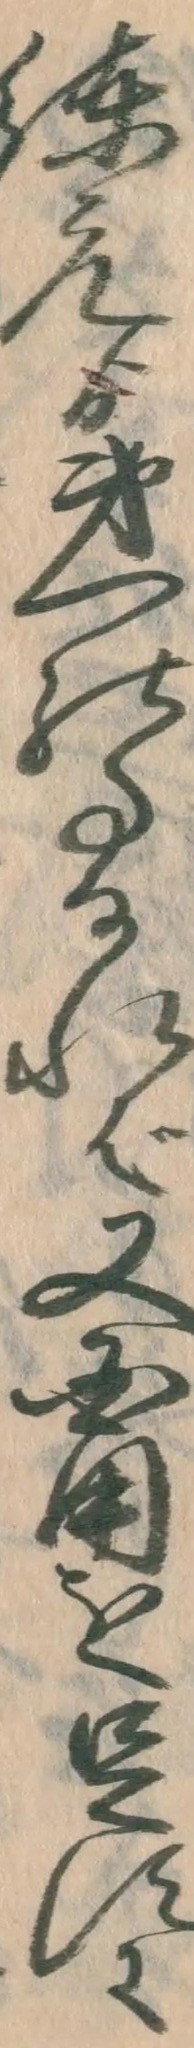練元ゟ第一の事なれば又国用を足すに
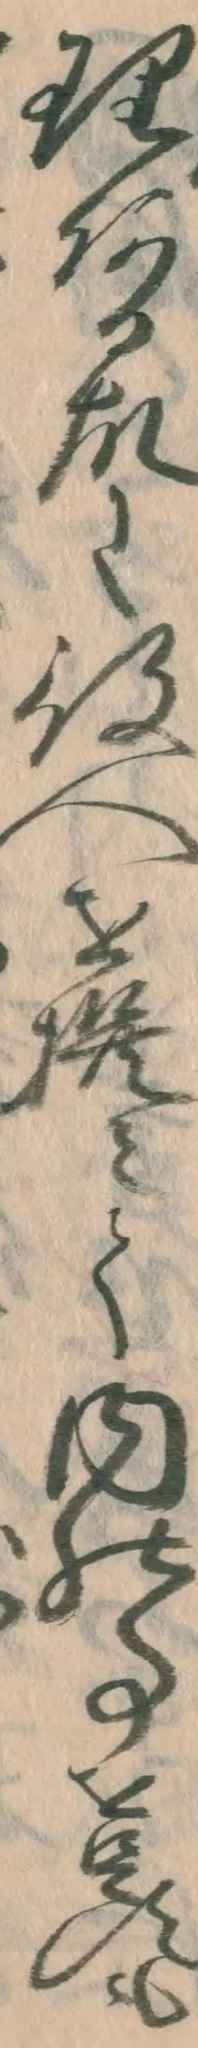理ある故に役人を撰ミて内の事を足すも
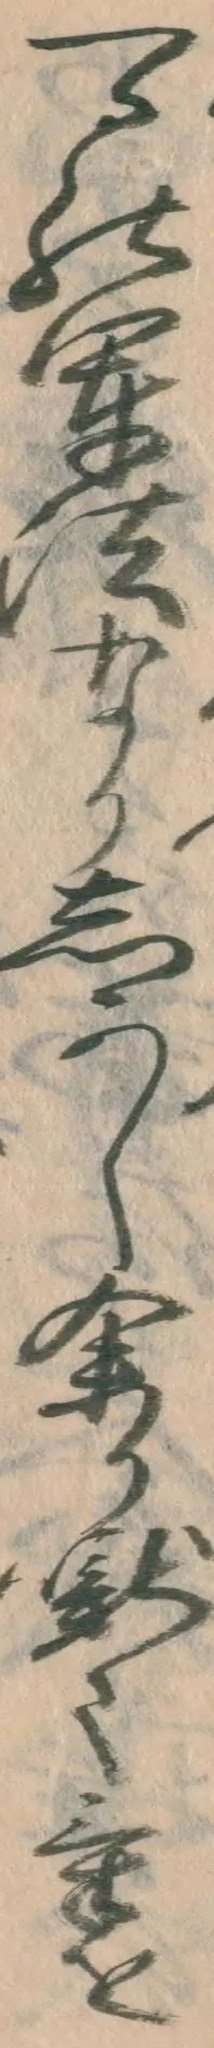一ツの軍法なりしかし余り噺に氣を
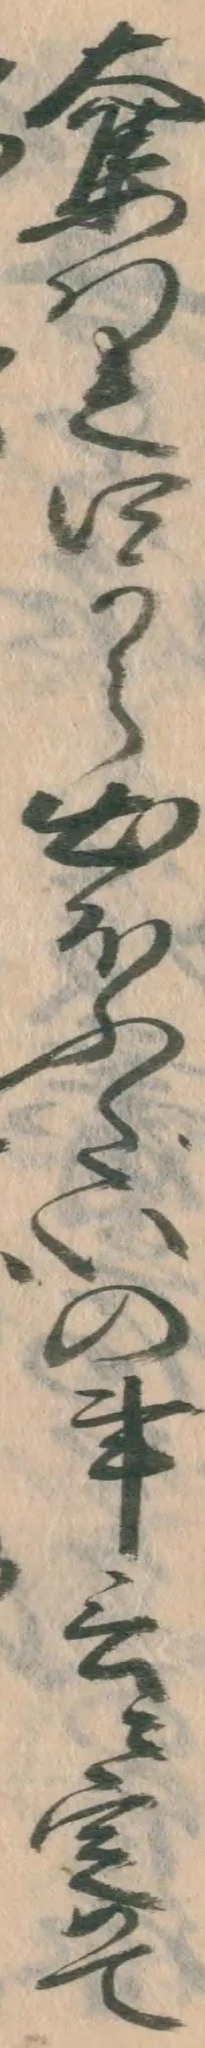奪われ口から出ほふだいの事云ニ定めて
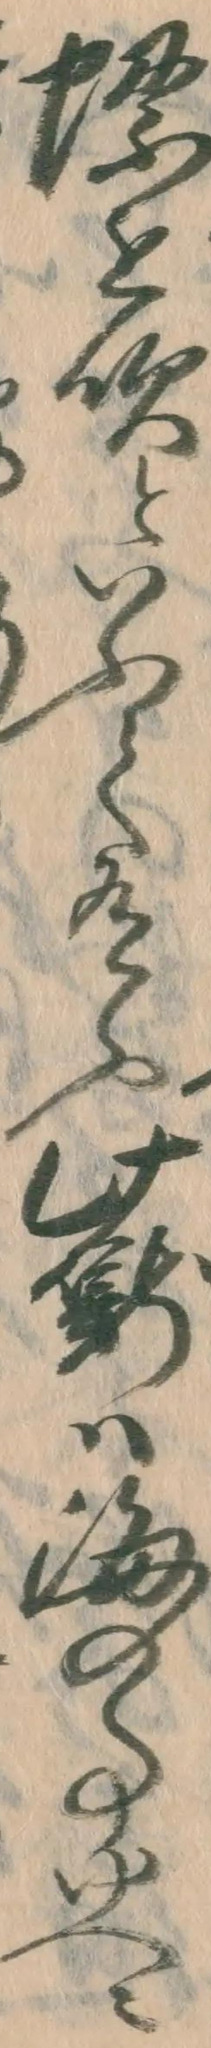螺を吹といふて有ふ此噺ハ海の事ゆへニ
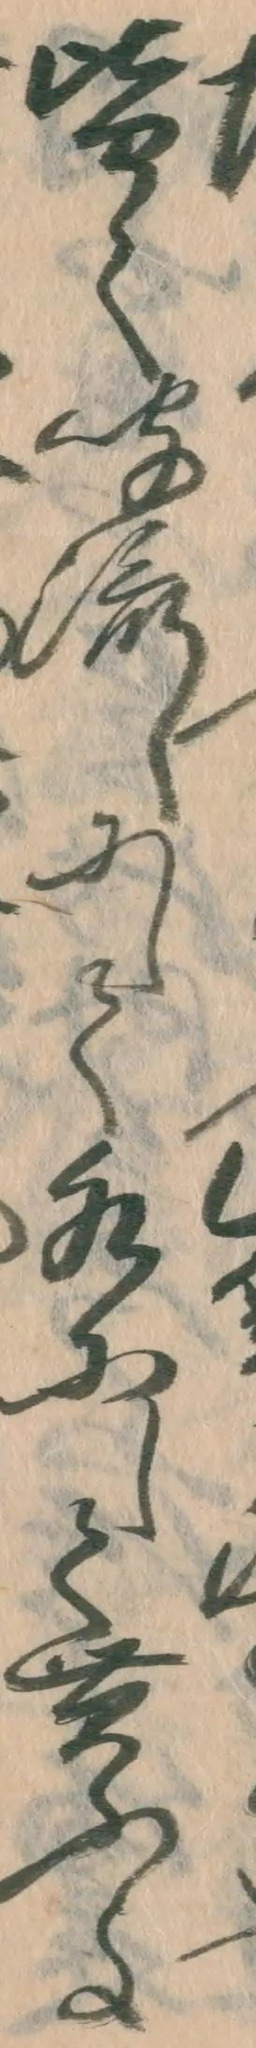皆〳〵聞流しにして水にして貰ふ事
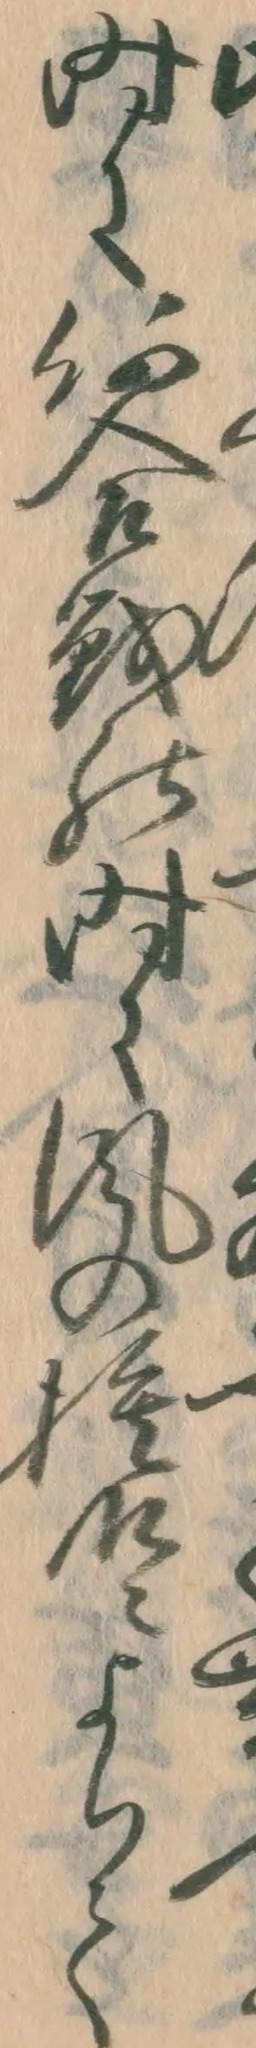時に何合戦の時に風の模様ニよりて
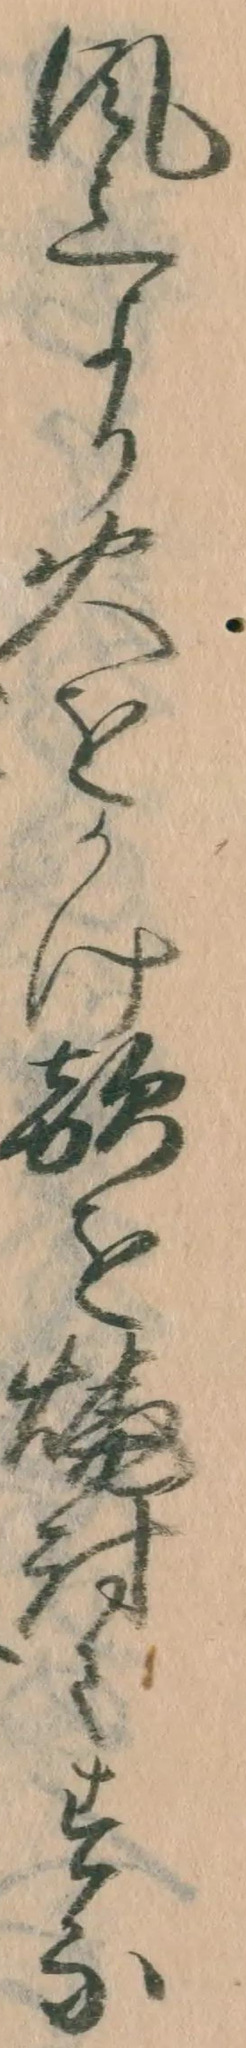風上より火をかけ敵を燒討にする
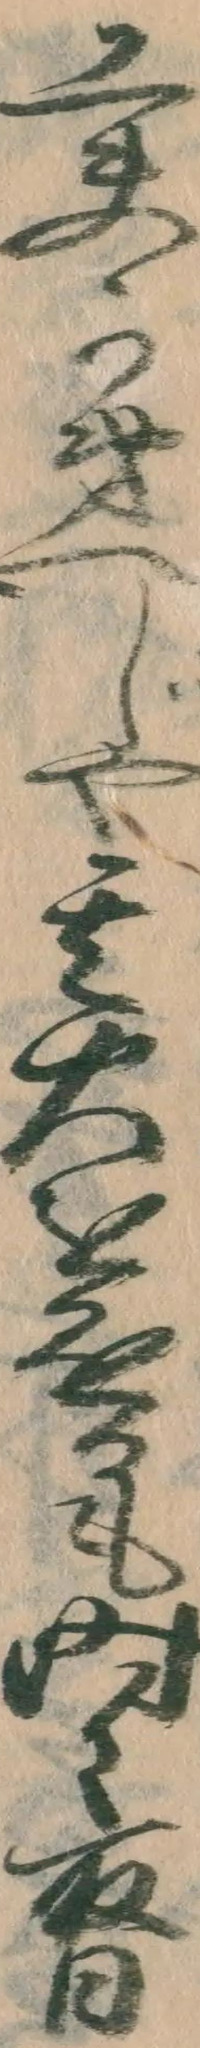工夫か第一じや其火を懸るも時に取日
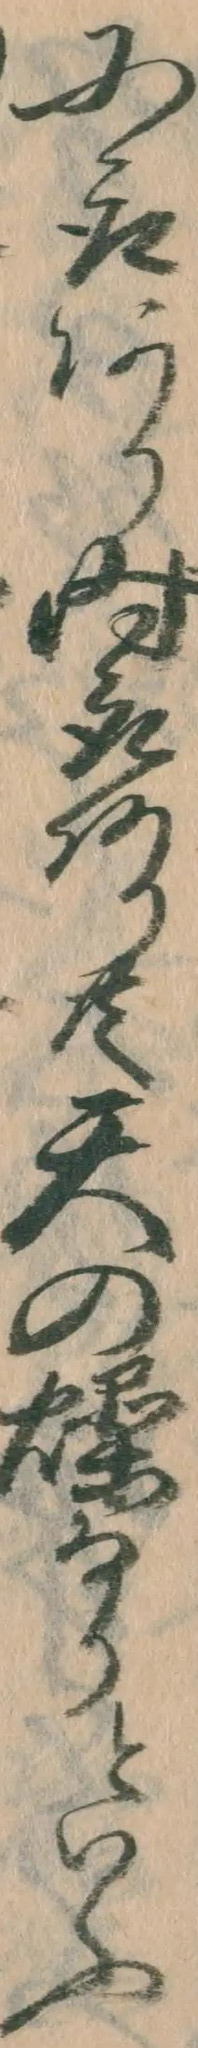に取あり時取あり共天の燥なりといふ
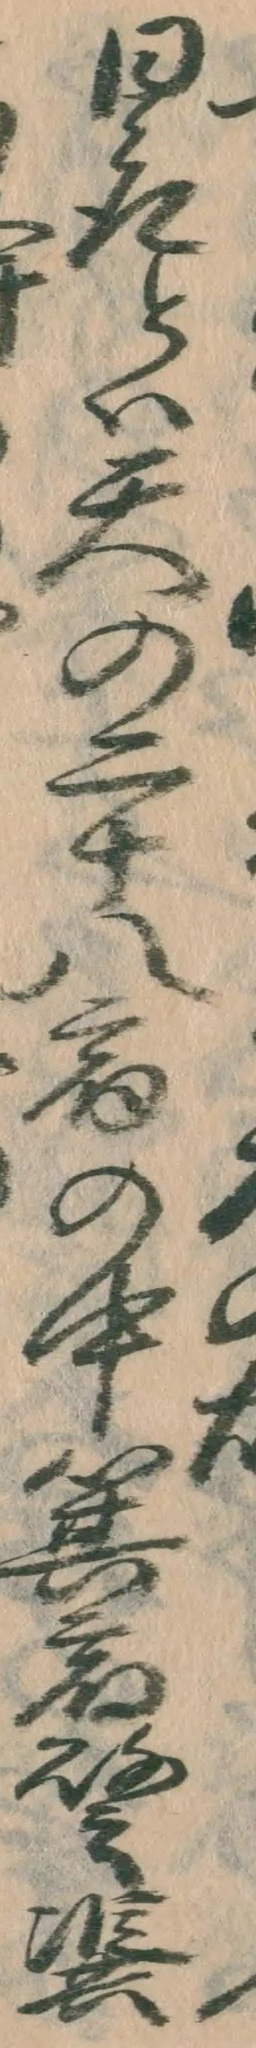日取とハ天の二十八宿の中箕宿壁翼
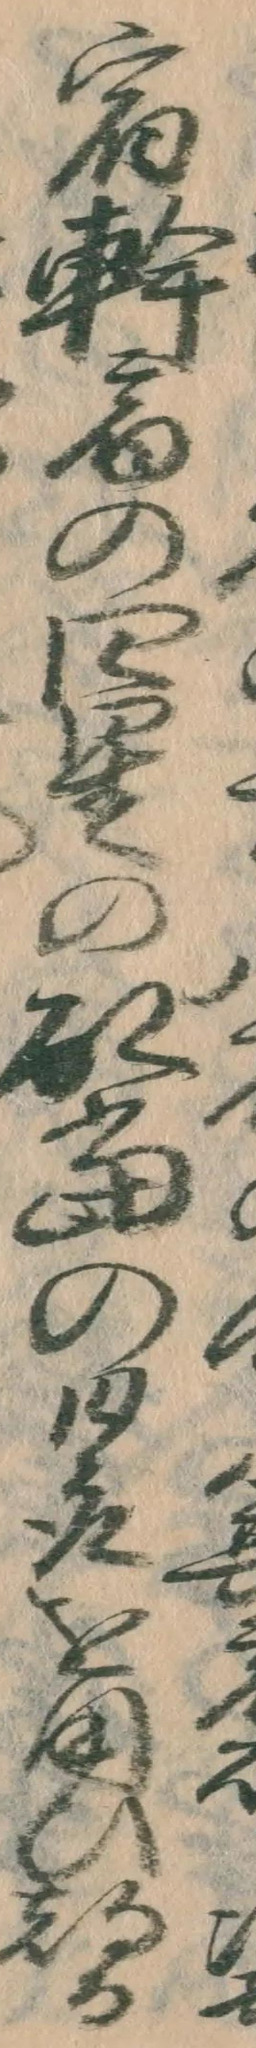宿幹宿の四星の配當の日取を用ひ都而
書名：麗斎叢書. 20
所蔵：国立国会図書館 National Diet Library, JAPAN
